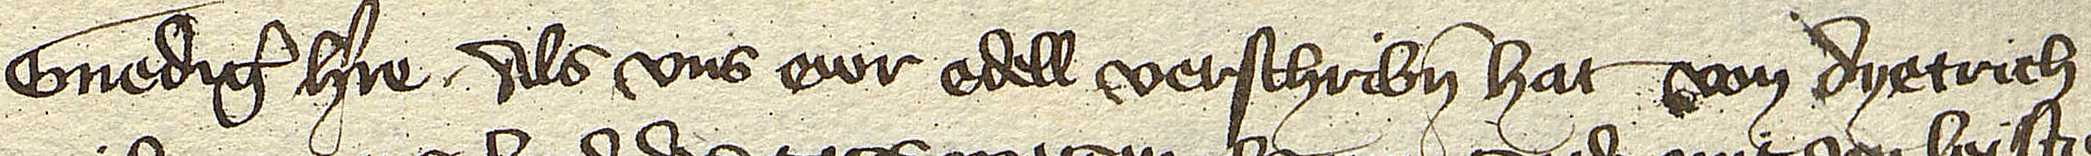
Gnedig* h*re / Als vns ewr edell verſchribn* hat von dyetrich
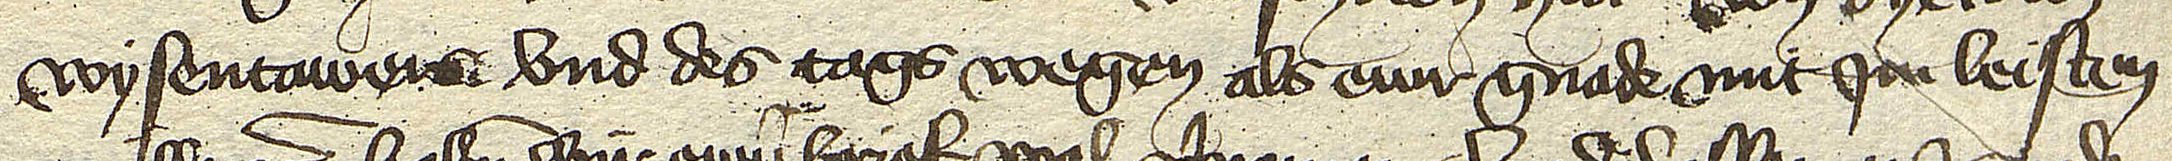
wyſentawers vnd des tags wegen als ewr gnade mit Im leiſten
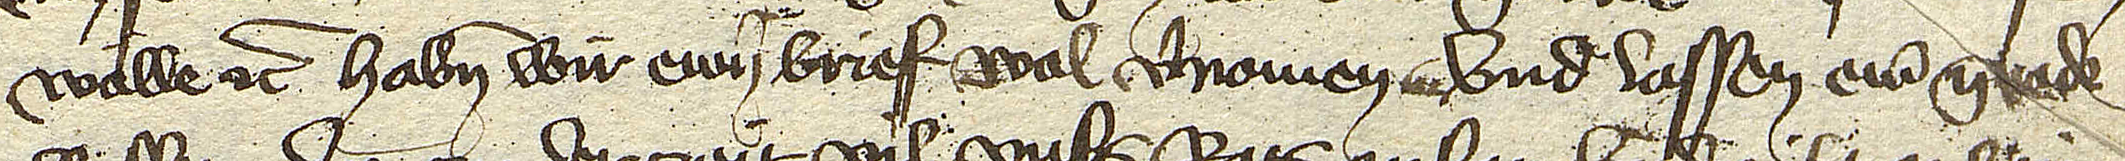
wölle ec* habn* wir ewn* brief wol v*nomen / vnd laſſen ew* gnade
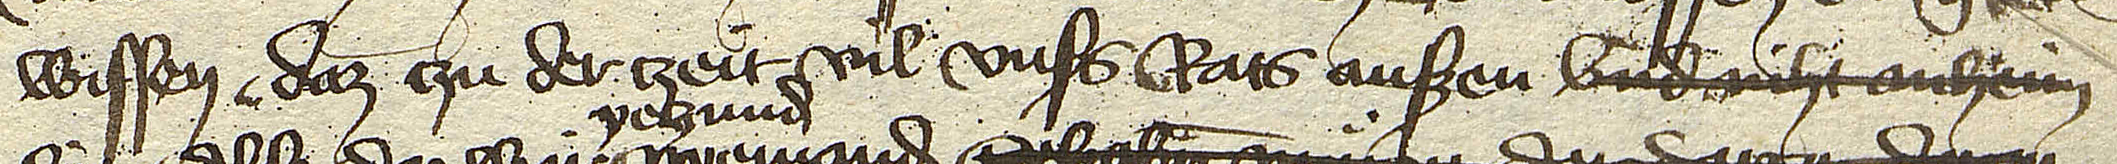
wiſſen / daʒ cʒu der cʒeit vil vnſ*s Rats auſʒen vnd niht anheim
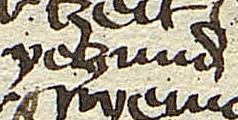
yecʒund*
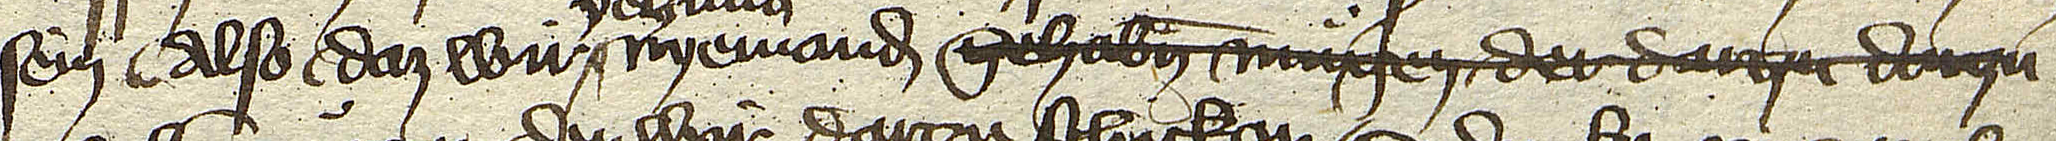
ſein / Alſo / daʒ wir nyemand* gehabn* mügen / der darcʒu darcʒu
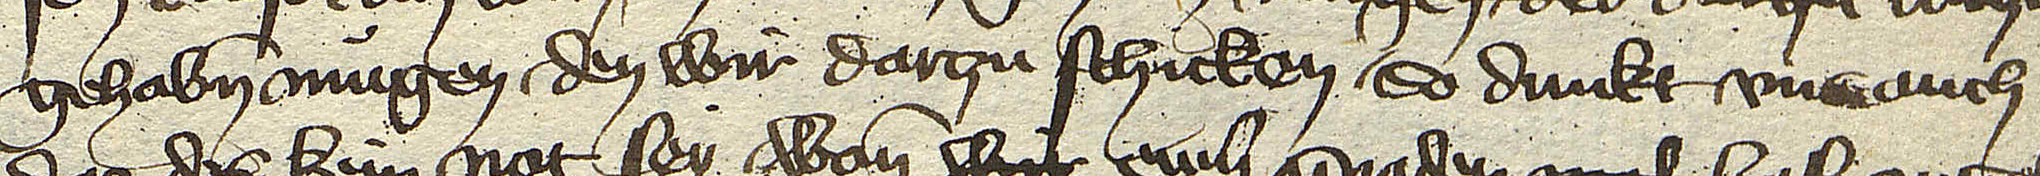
gehabn* mügen / den wir darcʒu ſchicken / So dunkt vns auch
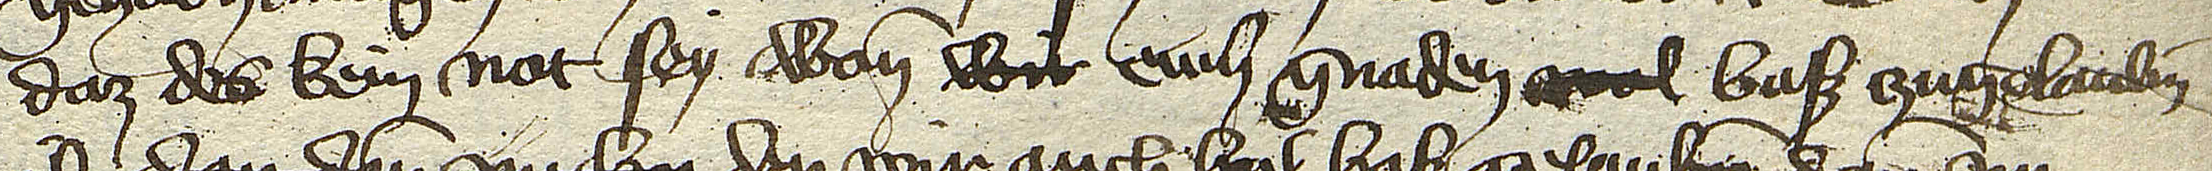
daʒ des kein not ſey / wan* wir ewn* gnaden wol baſʒ cʒugelaubn*
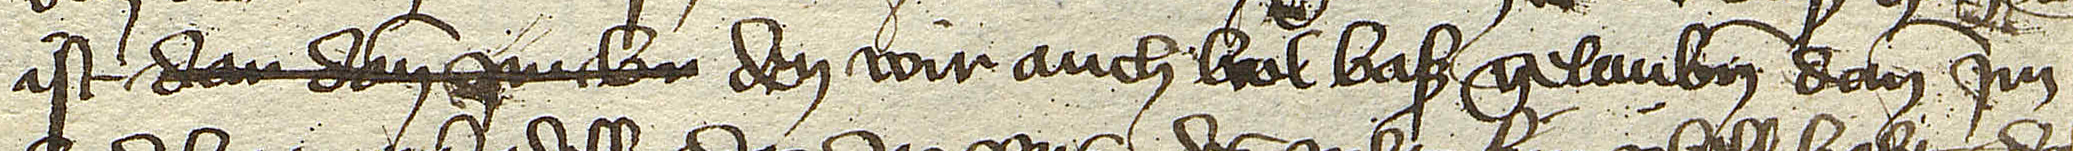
iſt / dar dan* cʒu / b den wir auch wol baſʒ gelaubn* dan* Im
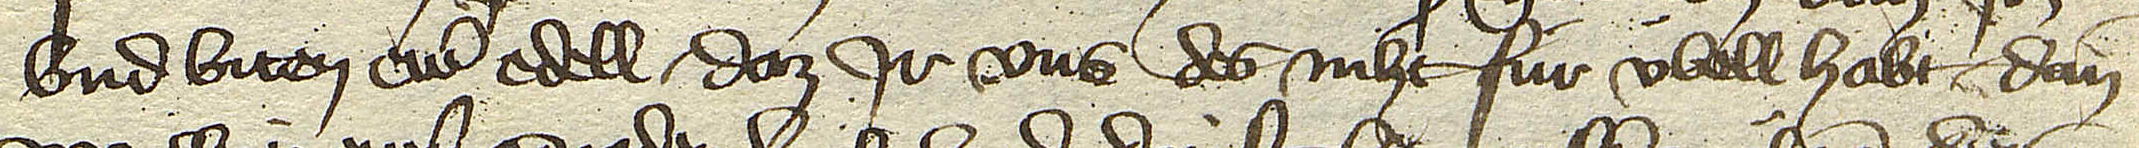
vnd biten ew* edell / daʒ Ir vns des niht für v̈bell habt / dan*
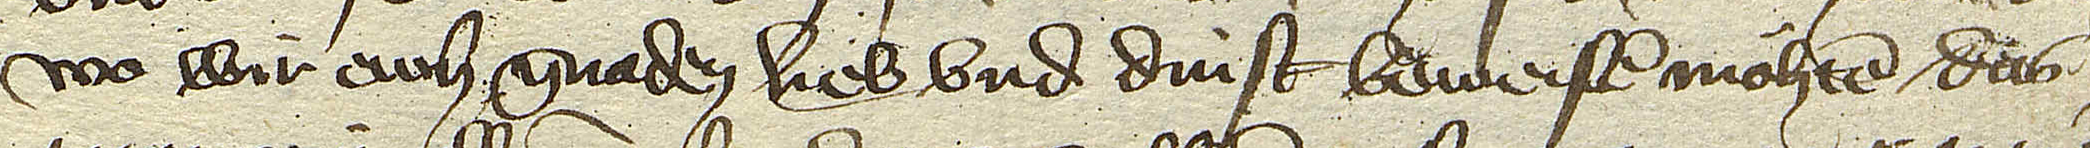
wo wir ewn* gnaden lieb vnd dinſt beweiſe* möhte* / das
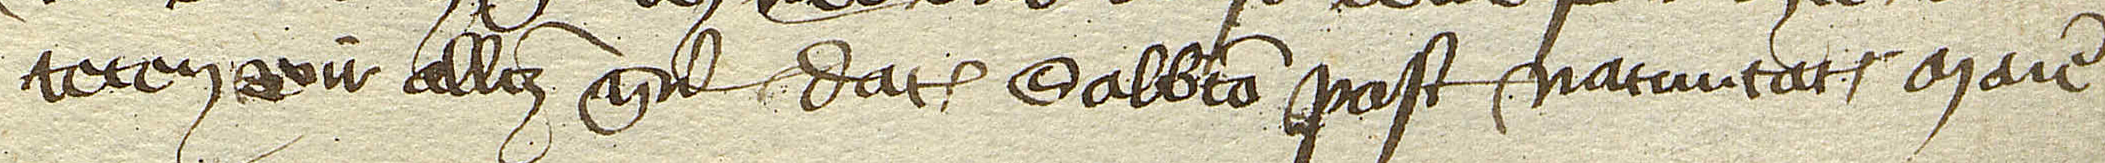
teten wir allcʒ* gn* / dat* Sabbto* poſt Natiuitat* Maie*
